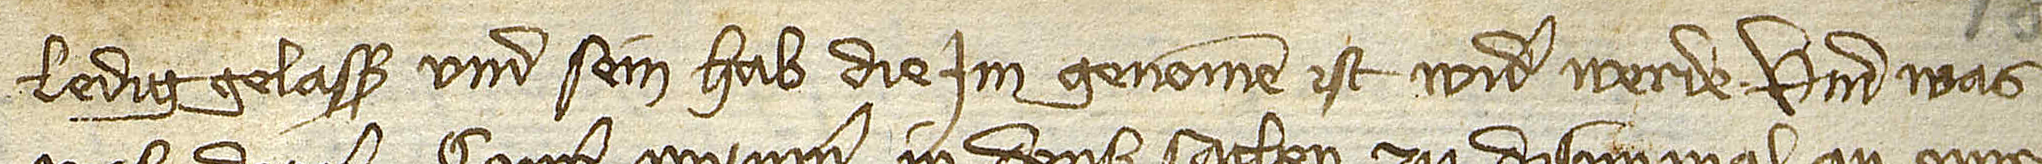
ledig gelaſſ* vnd ſein hab die Im genome* iſt wid* werde . Vnd was
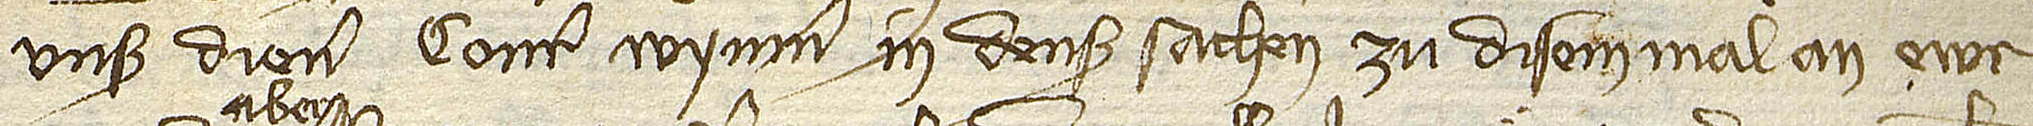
vnſ* dien* Conr* wymn* in denſ* ſachen ʒu diſem mal an ewr
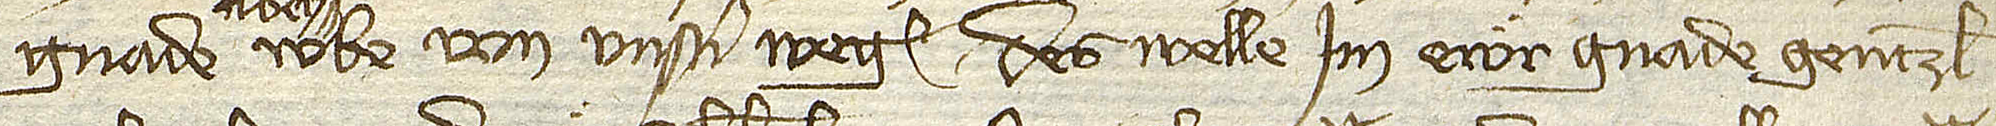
gnade w*be von vnſ*n weg* / Des welle Im ewr gnade gencʒl*
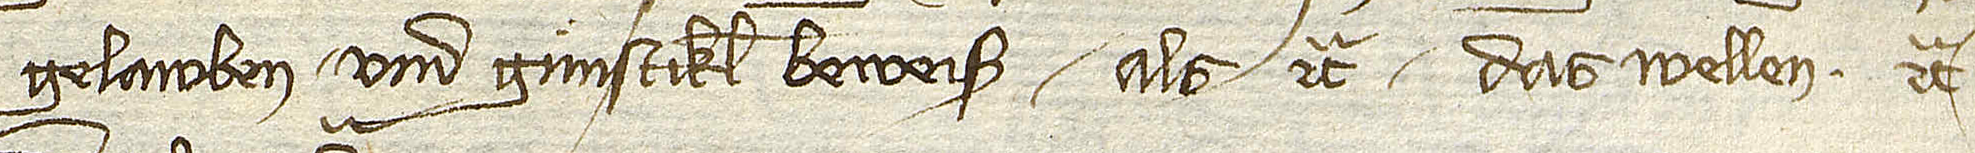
gelawben / vnd günſtikl* beweiſ* / als ec* / das wellen . ec*
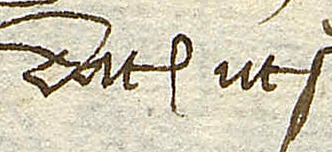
Dat* ut ſ*
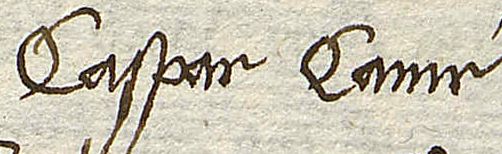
Caſpar Camr*
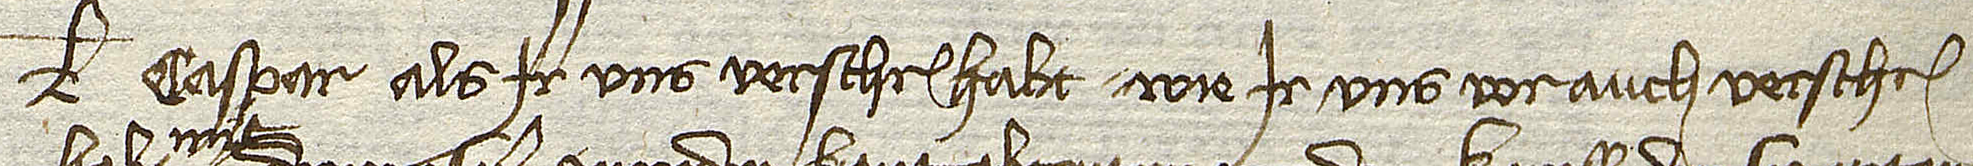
L* Caſpar als Ir vns verſchr* habt / wie Ir vns vor auch verſchr*
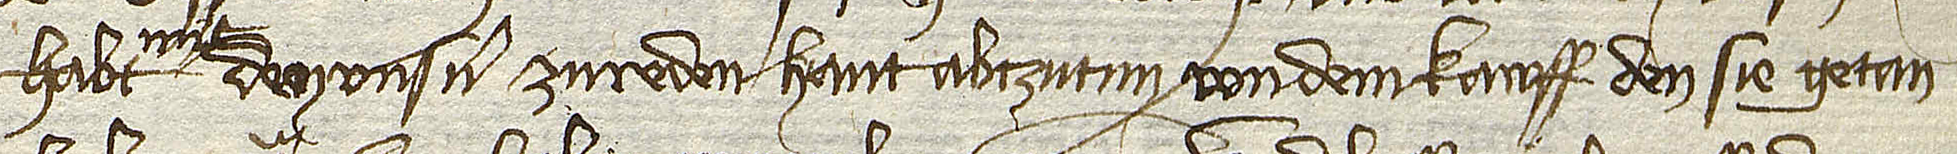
habt den vnſ*n ʒureden hant abcʒutun von dem kawff den ſie getan
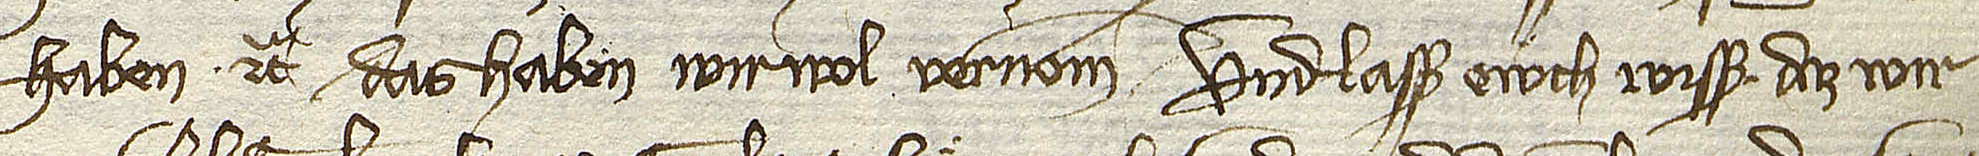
haben . ec* / das haben wir wol vernom* / Vnd laſſ* ewch wiſſ* . daʒ wir
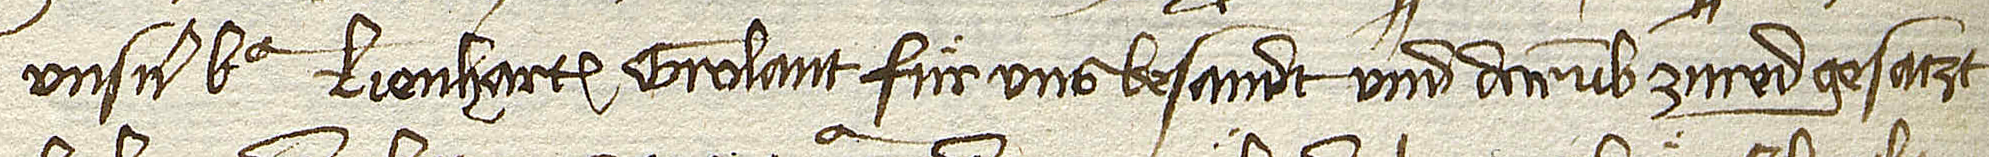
vnſ*n b* Lienhart* Grolant für vns beſandt vnd darub* ʒured geſacʒt
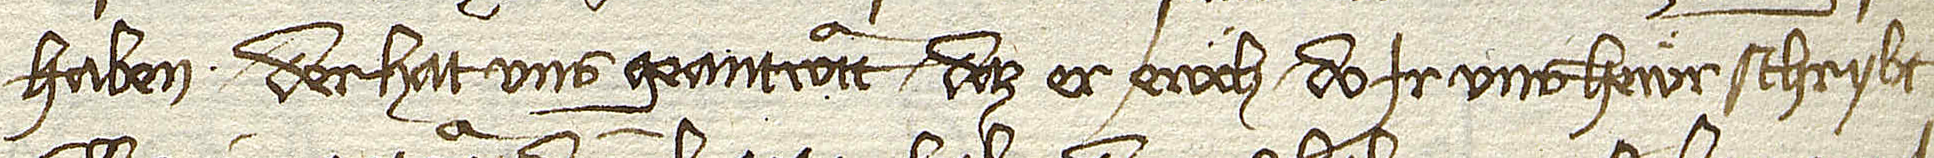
haben . / Der hat vns geantw*tt / daʒ er ewch / do Ir vns hewr ſchrybt
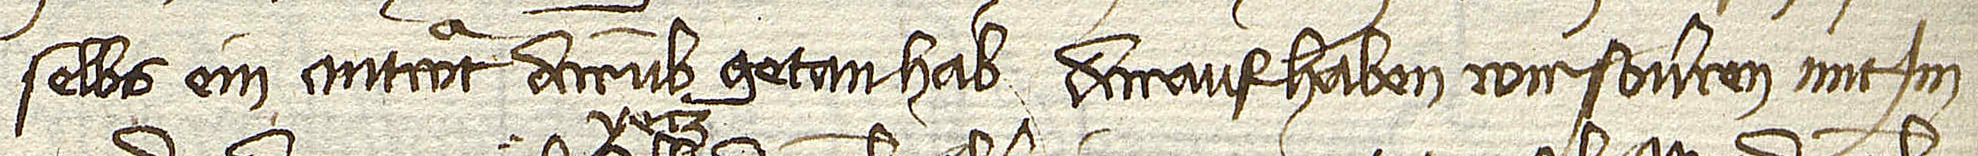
ſelbs ein antw*t daru*b getan hab darauf haben wir ſou*ren mit Im
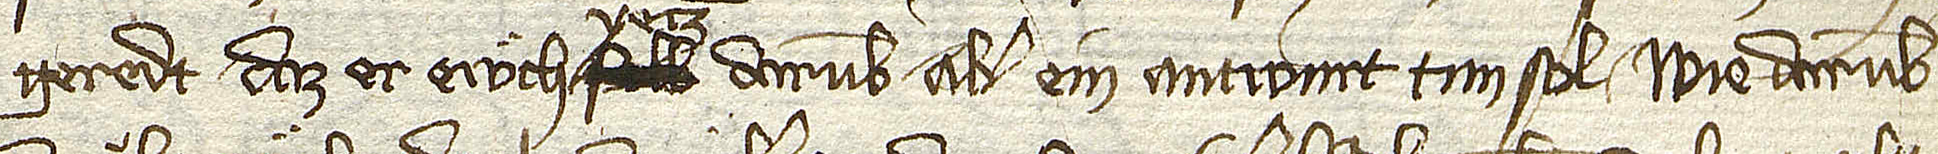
geredt / daʒ er ewch ſelb daru*b / ab* ein antwurt tun ſol / wie darub*
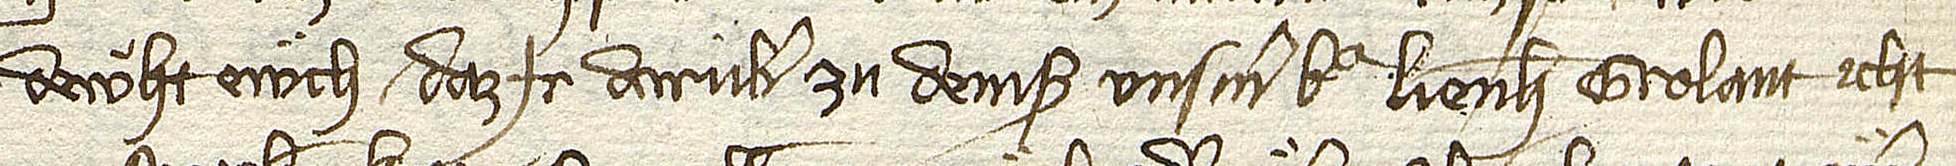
dewcht ewch / daʒ Ir darüb* ʒu demſ* vnſ*m b* lienh* Grolant icht
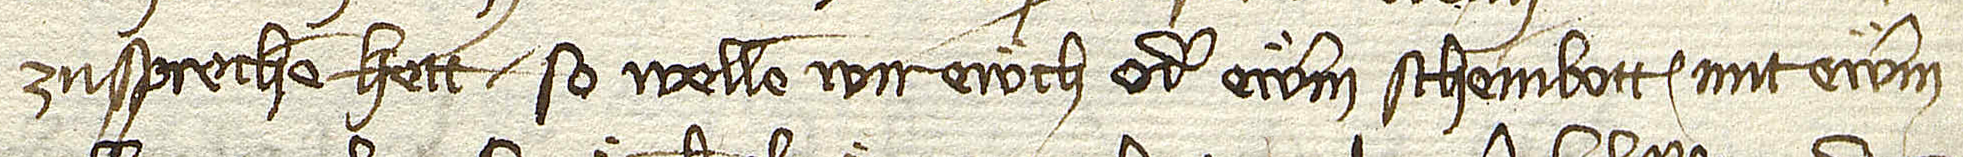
ʒuſpreche* hett / ſo welle* wir ewch od* ew*n ſcheinbott* mit ew*m
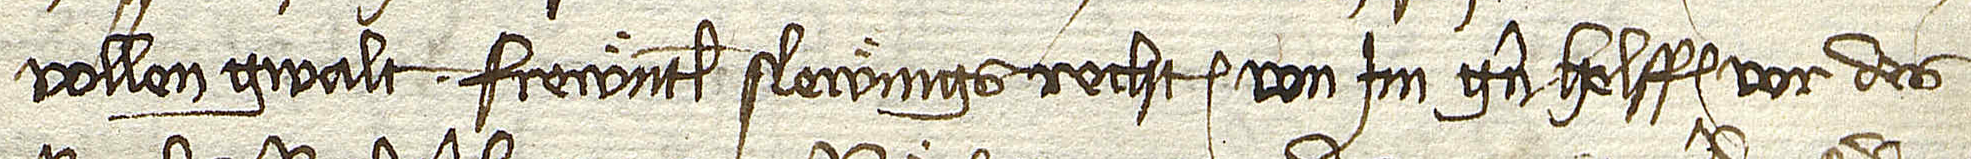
vollen gwalt . frewntl* ſlewnigs recht* von Im g*n helff* vor des
